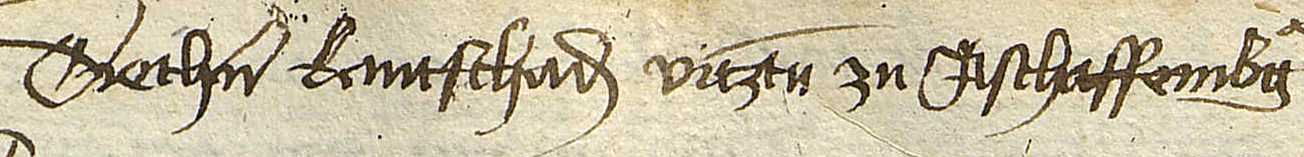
Dieth*n lantſschad* vicʒtu* ʒu Aſchaffemb*g
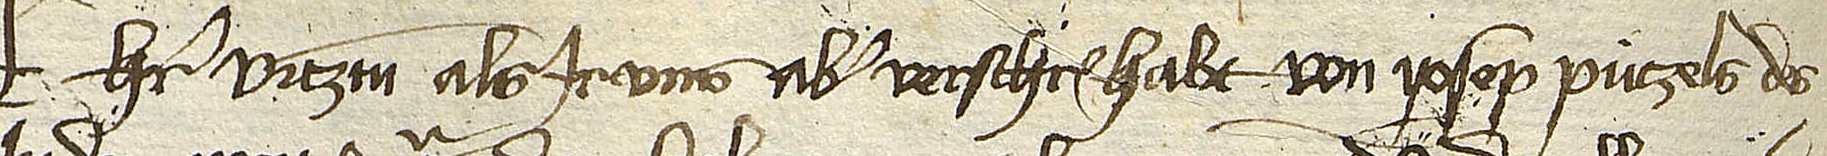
L* h*r vicʒtu* als Ir vns ab* verſchr* habt von yoſep Pücʒels des
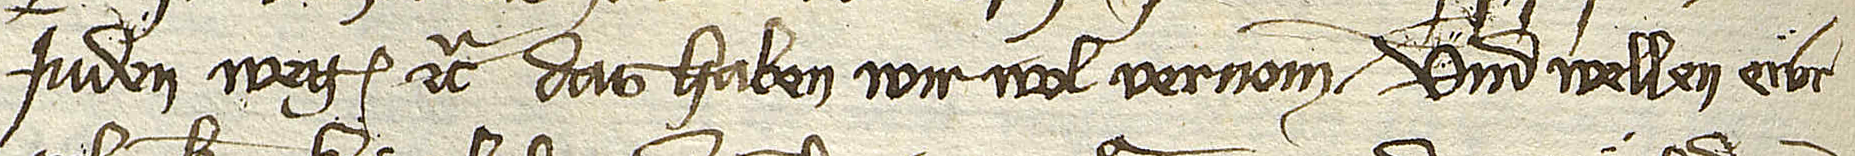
Iuden weg* ec* das haben wir wol vernom* / Vnd wellen ew*r
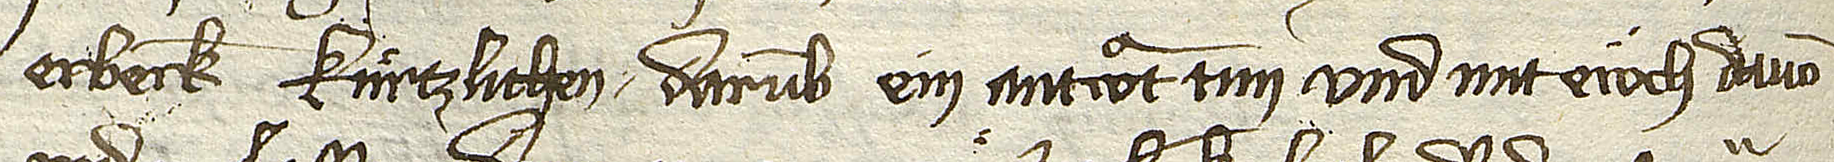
erberk* kürcʒlichen / darub* ein antw*t tun vnd mit ewch dauo*
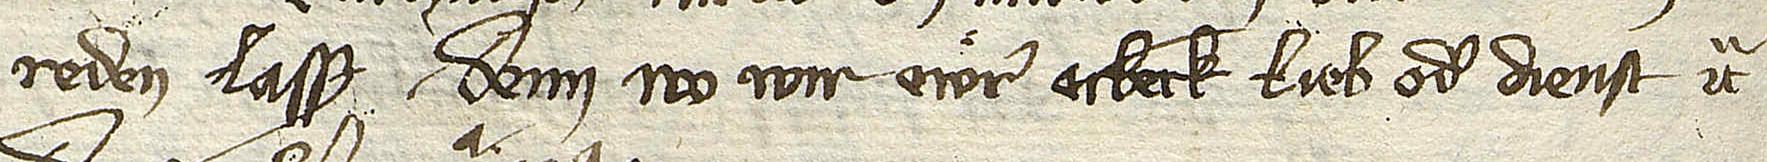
reden laſſ* / Denn wo wir ewr* erberk* lieb od* dienſt ec*
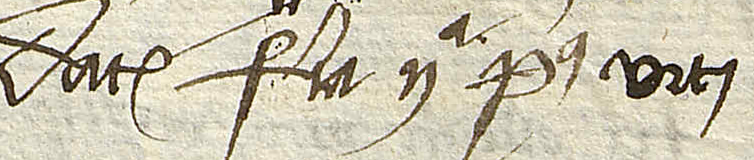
Dat* fia* ii* P* Viti
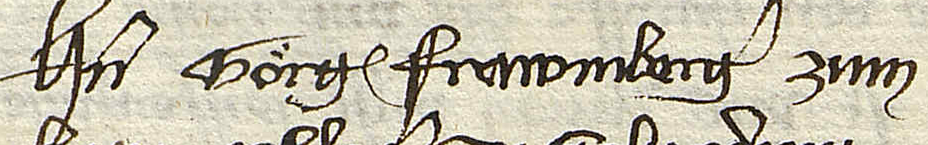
H*n Görg* frawmberg* ʒum
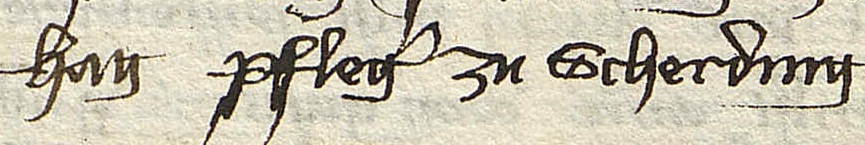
hag Pfleg* ʒu Scherding
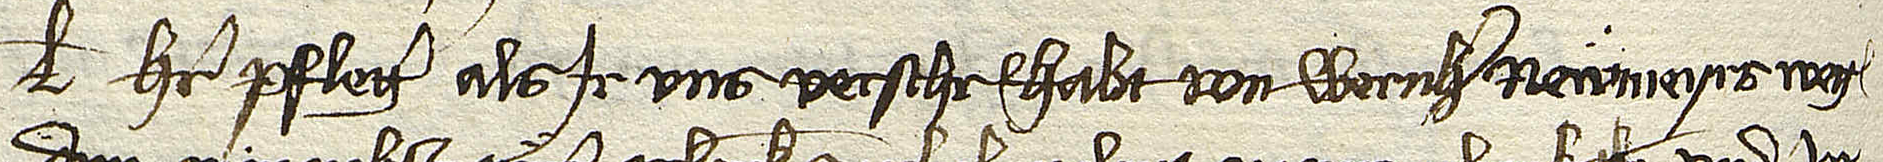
L* hr* Pfleg* als Ir vns verſchr* habt von Wernh* Newmeyrs weg*
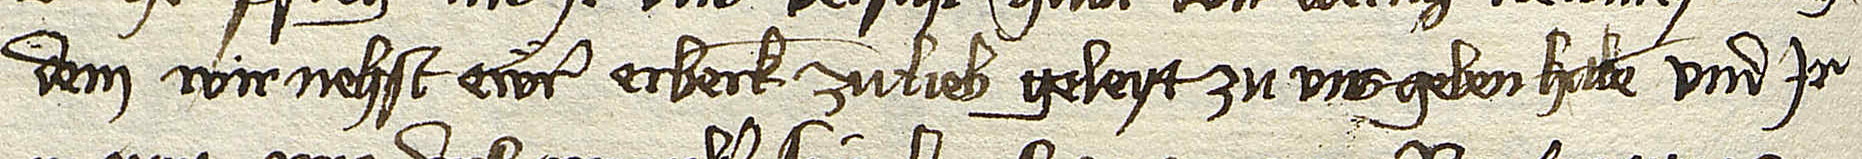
dem wir nehſt ewr* erberk* ʒulieb geleyt ʒu vns geben habe* vnd Ir
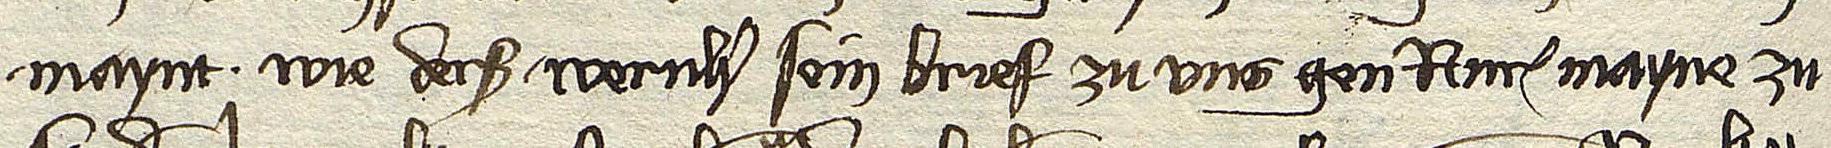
maynt . wie derſ* wernh* ſein brief ʒu vns gen Nur* mayne ʒu
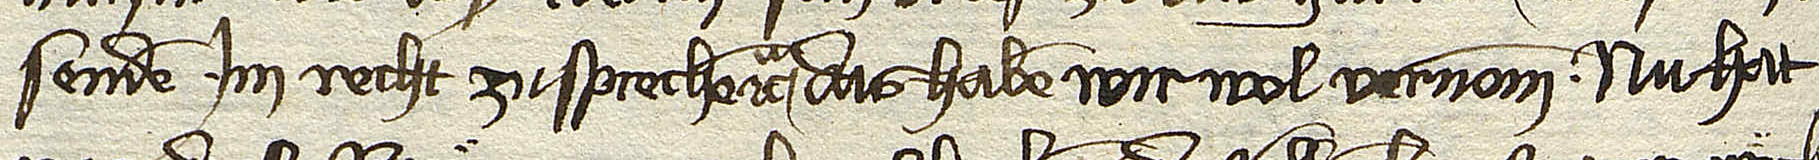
ſende* Im recht ʒuſpreche* ec* / das habe* wir wol vernom* . Nu hat
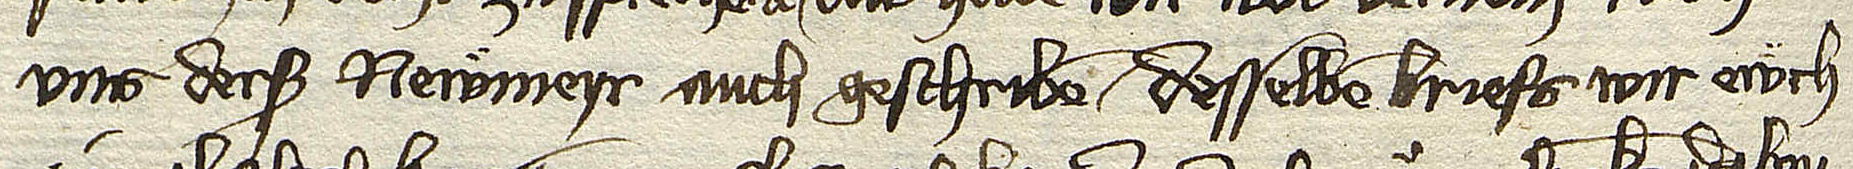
vns derſ* Newmeyr auch geſchribe* / deſſelbe* briefs wir ewch
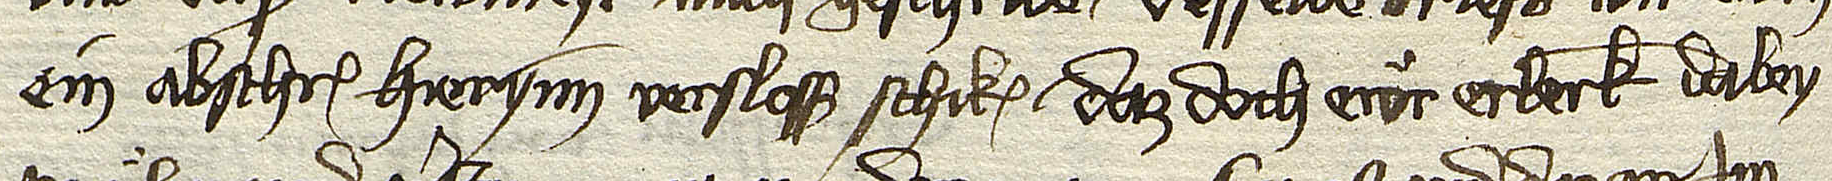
ein abſchr* hierynn* verſloſſ* ſchik* / daʒ doch ewr erberk* dabey
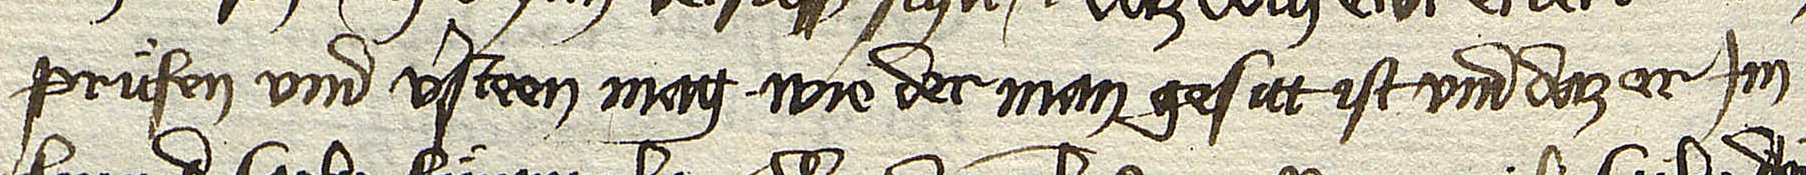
prüfen vnd v*ſteen mag . wie der man geſitt iſt vnd daʒ er Im
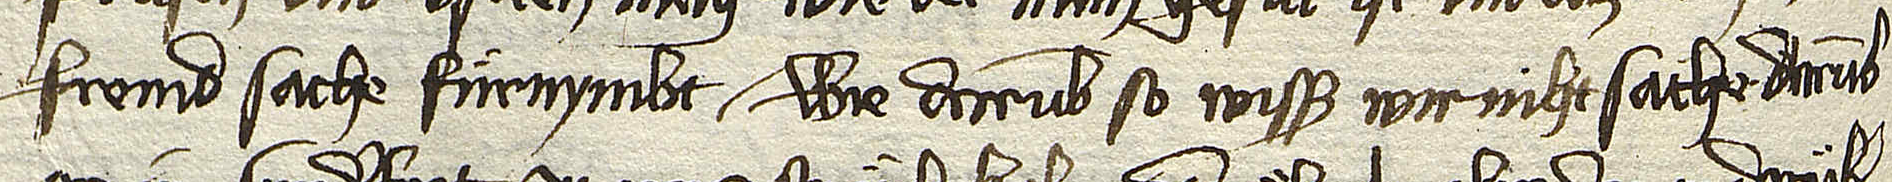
fremd ſache fürnymbt / Wie darub* ſo wiſſ* wir niht ſache darub*
